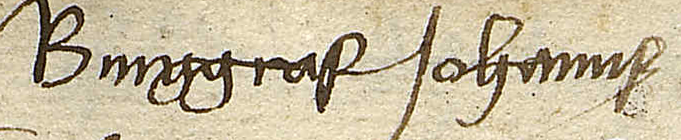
Burggraf Iohannſ*
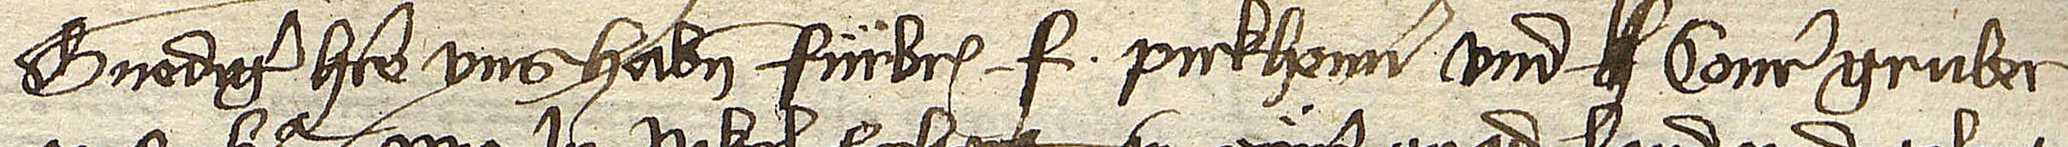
Gnedig* h*re vns habn* fürbr* . f . pirkheim* vnd h Conr* gruber
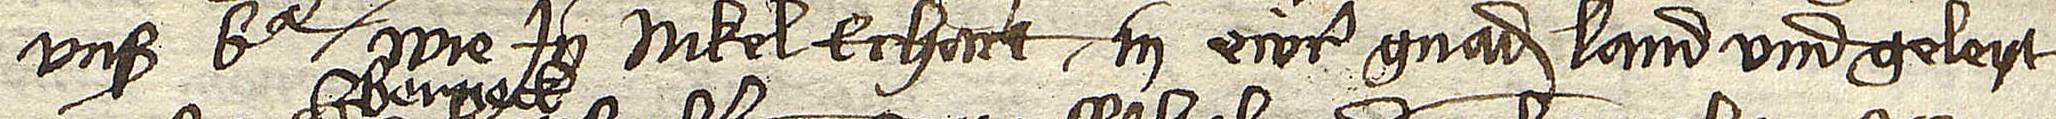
vnſ* b* / wie In Nikel Erhart / in eẅr* gnad* land vnd geleyt
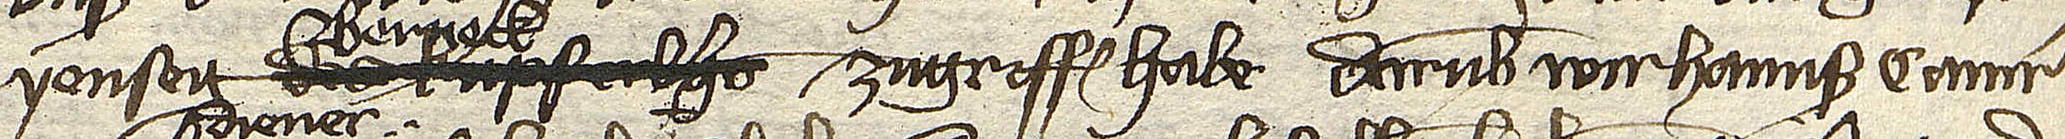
yenſeit des kupferb*gs / ʒugriff* habe darub* wir hannſ* Camr*
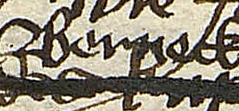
%berneck
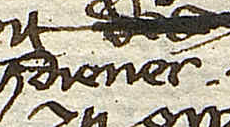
diener
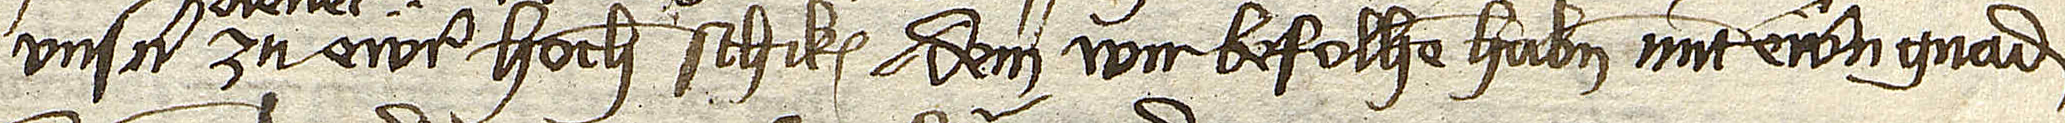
vnſn* ʒu eẅr* hoch* ſchik* / Dem wir befolhe* habn* mit eẅ*n gnad*
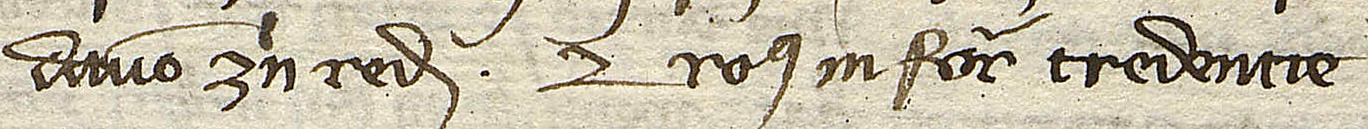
dauo* ʒu red* . @ ro* in for* credencie
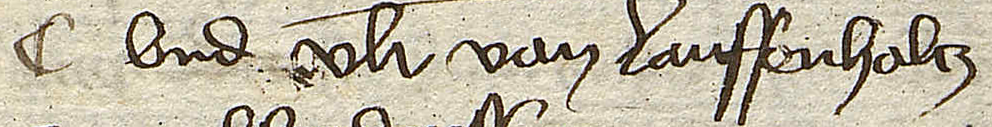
C* vnd vlr* von lauffenholcʒ
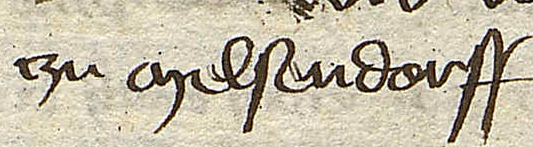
cʒu Melſendorff
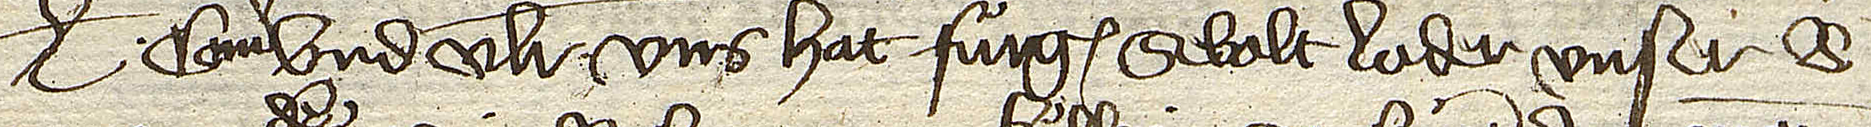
L* Conr* vnd vlr* vns hat fürg* Sebolt loder vnſer B*
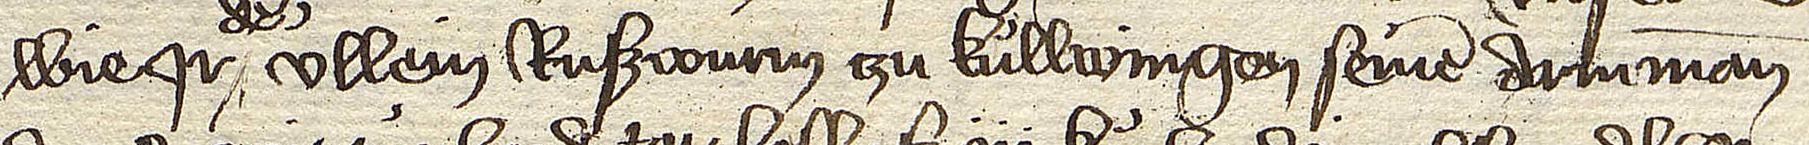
wie Ir v̈llein Ruſʒwurm cʒu küllwingen ſeine* Armman*
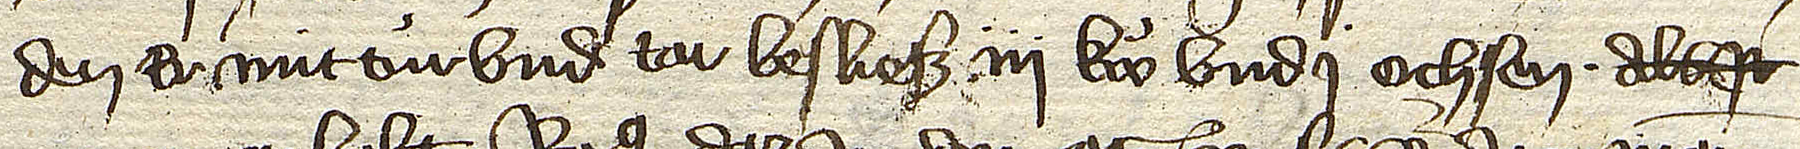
den Er mit tür vnd tor beſlieſʒ iii kẅ vnd Ochſen . Als Ir
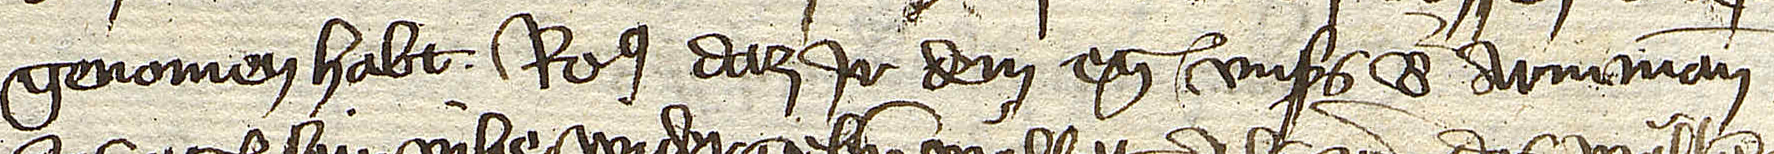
genomen habt . Ro* daʒ Ir dem eg* vnſ*s B* Armman*
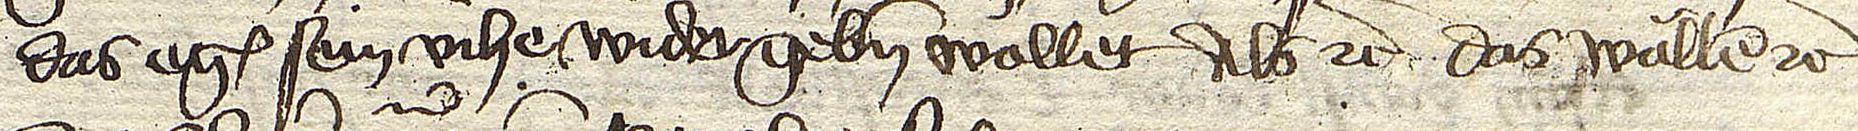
das eg* ſein vihe wider gebn* wöllet Als ec* das wölle* ec*
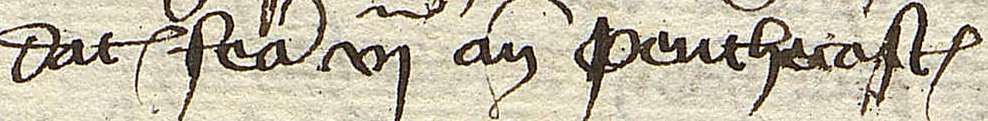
dat* fea* vi* an* Penthecoſt*
